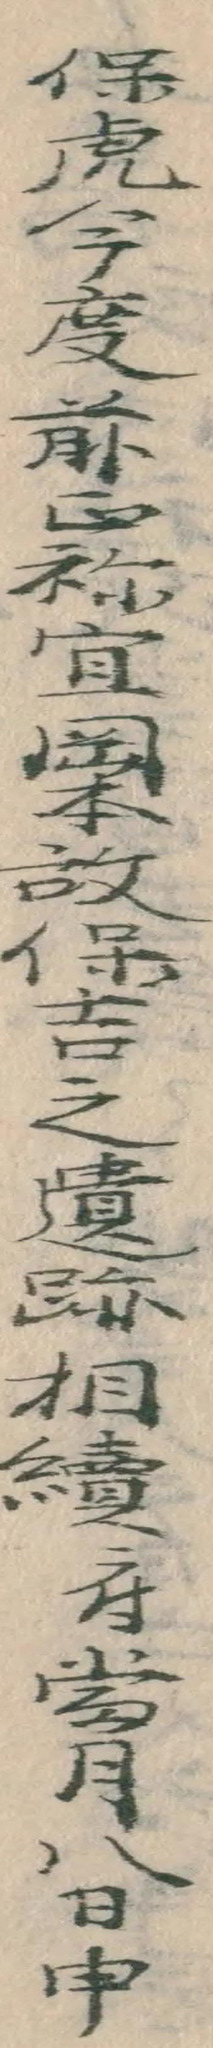保虎今度前正称宜岡本故保吉之遺跡相續ニ付當月八日申
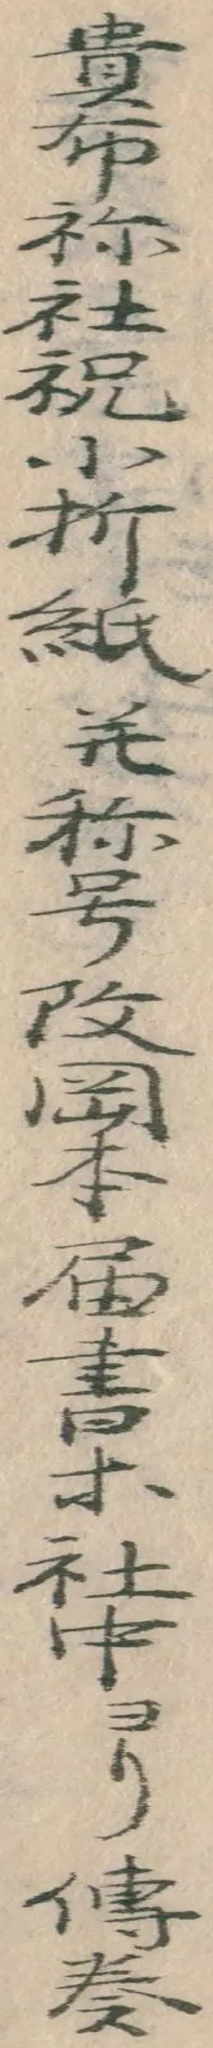貴布祢社祝小折紙并称号改岡本届書等社中ヨリ伝奏
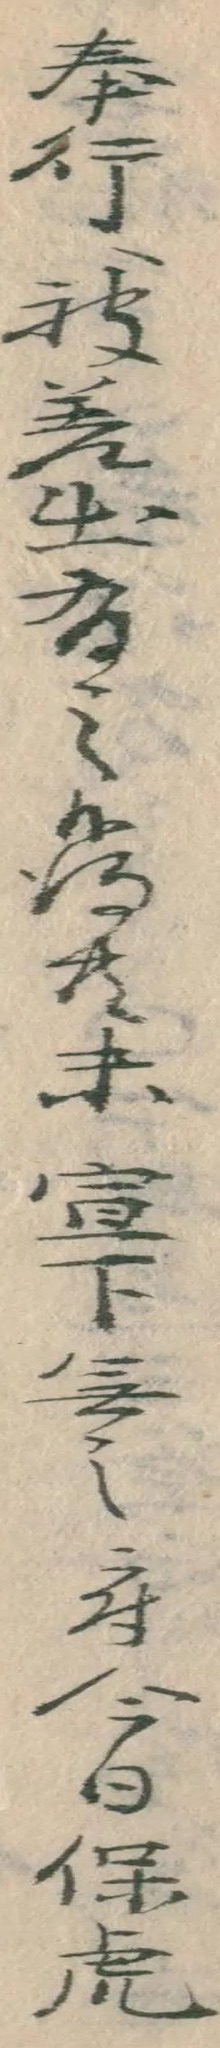奉行へ被差出有之候得共未宣下無之ニ付今日保虎
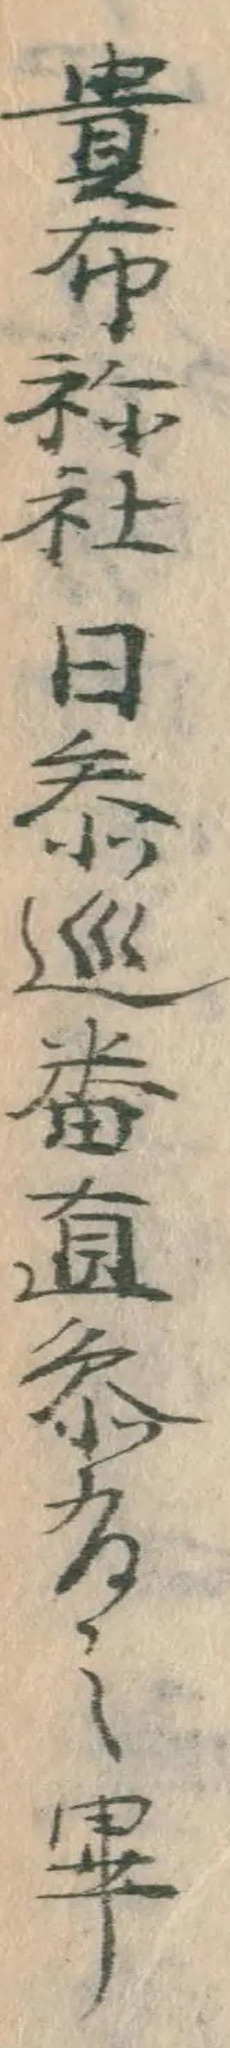貴布称社日参巡番直参有之畢

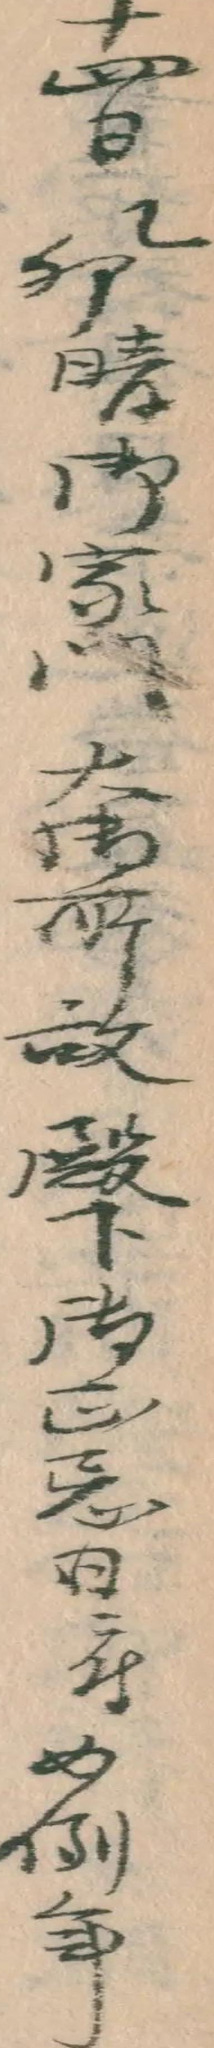十四日乙卯晴御家門大御所故殿下御正忌日ニ付如例年
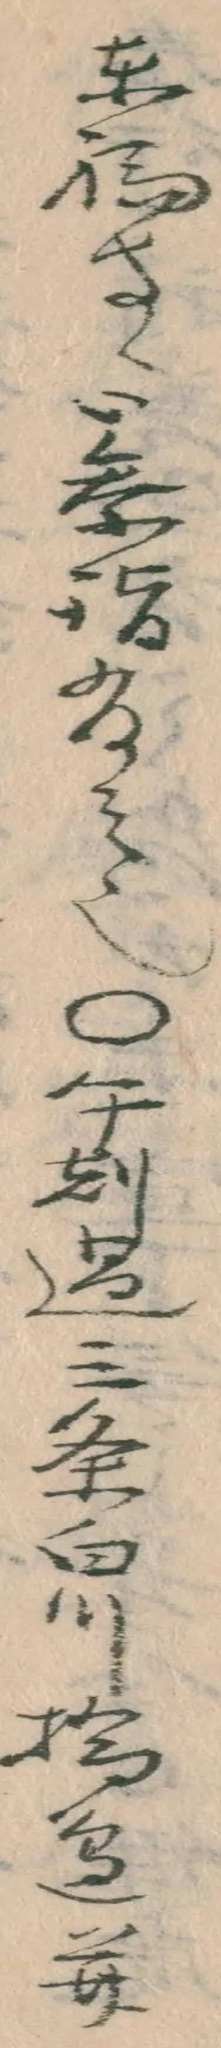東福寺へ御参詣有之也○午刻過三条白川橋邉并
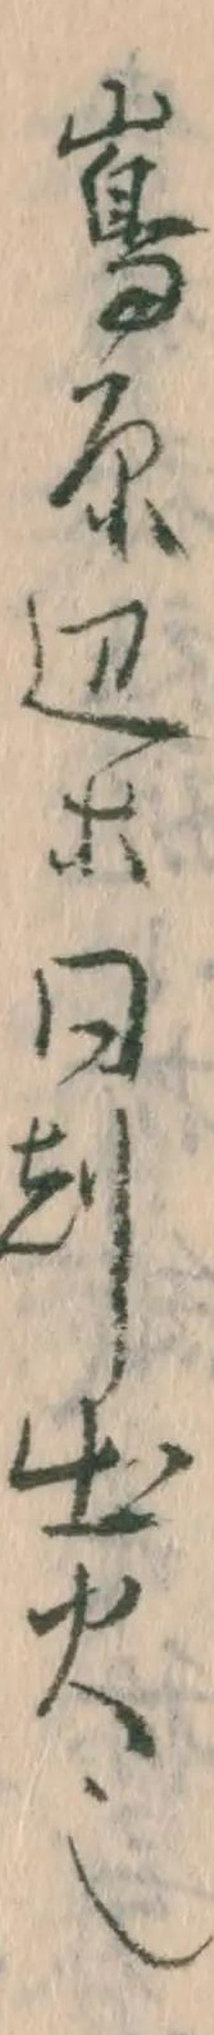嶌原辺等同刻出火也
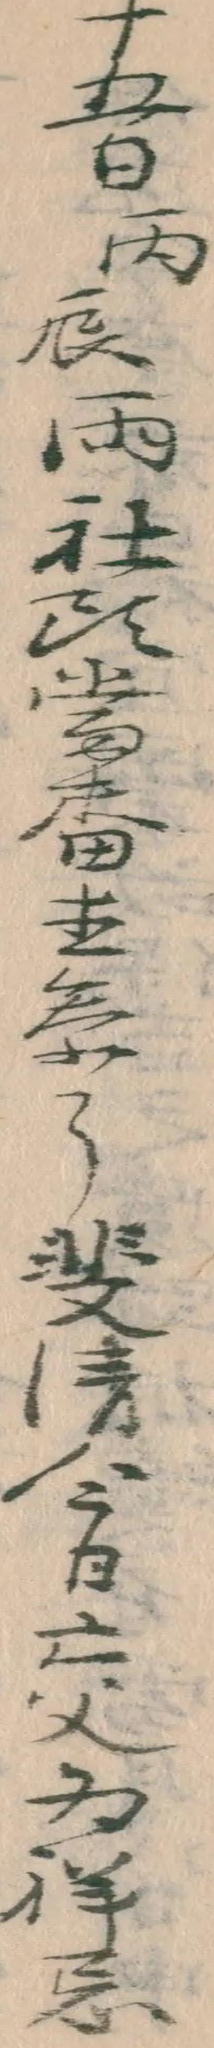十五日丙辰両社頭當番直参了斐清今日亡父為祥忌
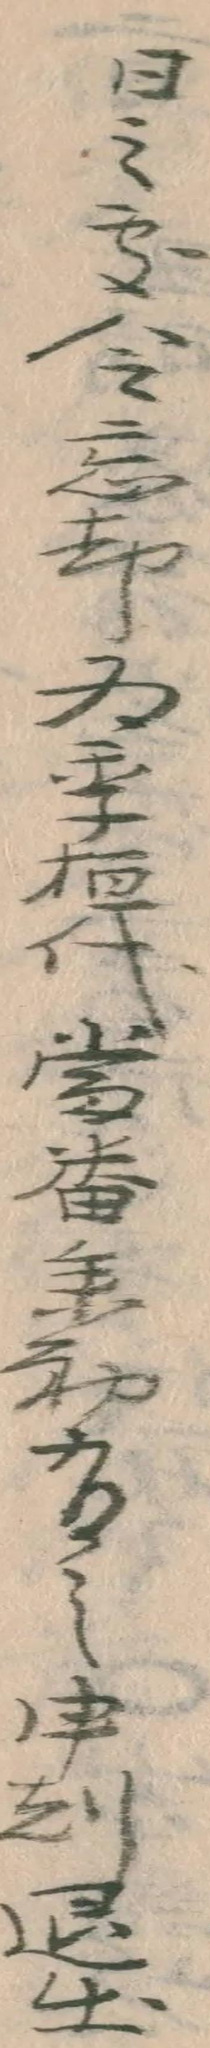日之砌令忘却為季恒代當番参勤有之申刻退出
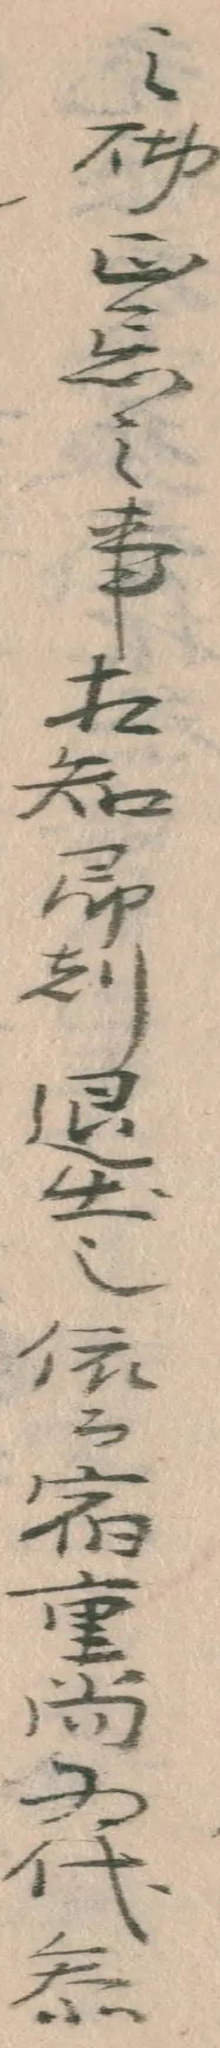之砌正忌之事相知即刻退出也依而宿重尚為代参
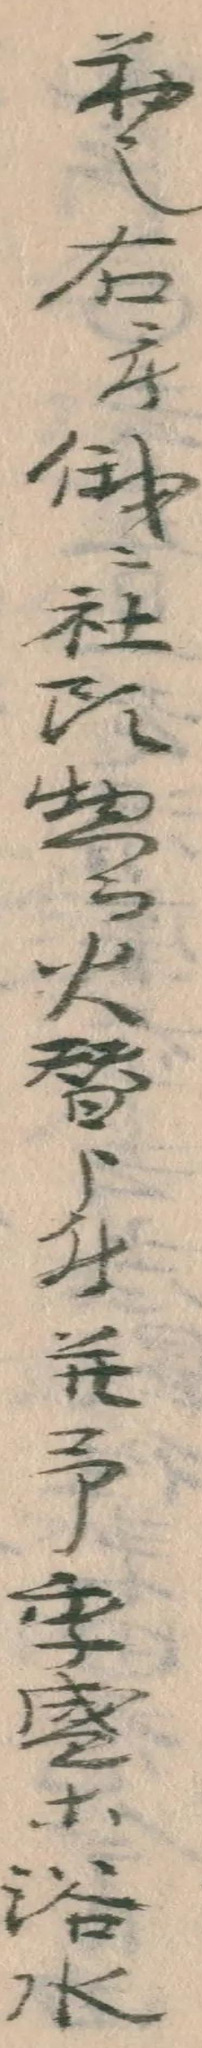勤也右ニ付俄ニ社頭惣而火替申付并予季盛等浴水
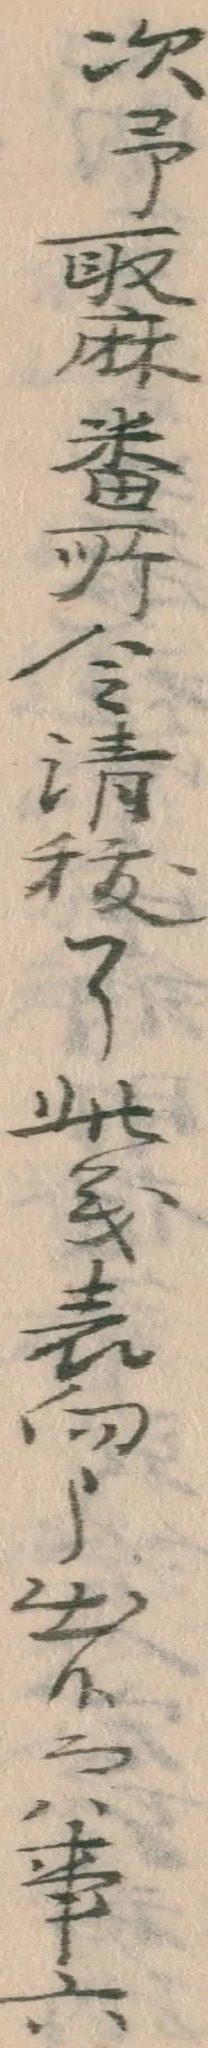次予取麻番所令清祓了此義表向申出候而ハ事六
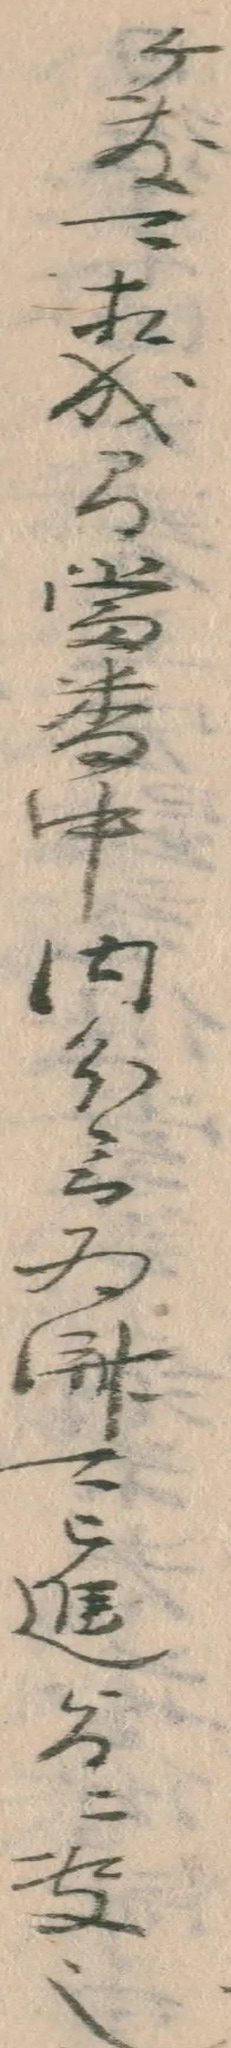ケ度可相成間當番中内分ニ而為済可被進旨ニ決也
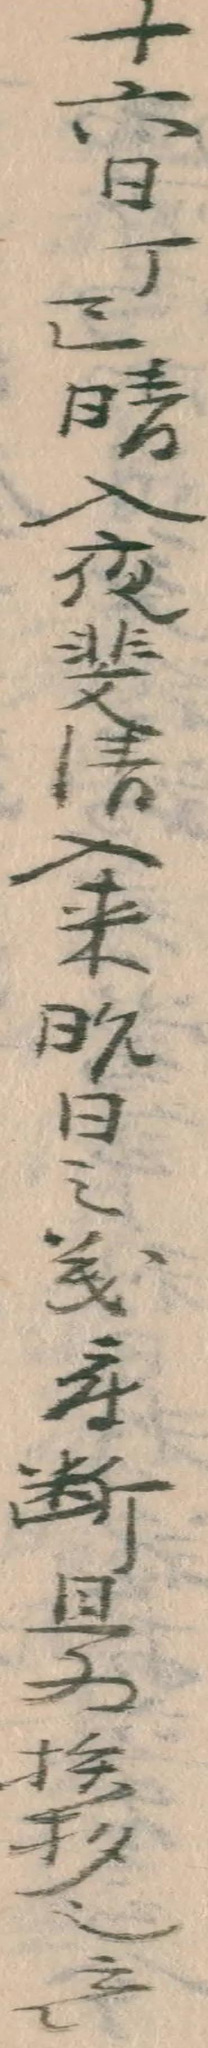十六日丁巳晴入夜斐清入来昨日之義ニ付断且為挨拶也云々
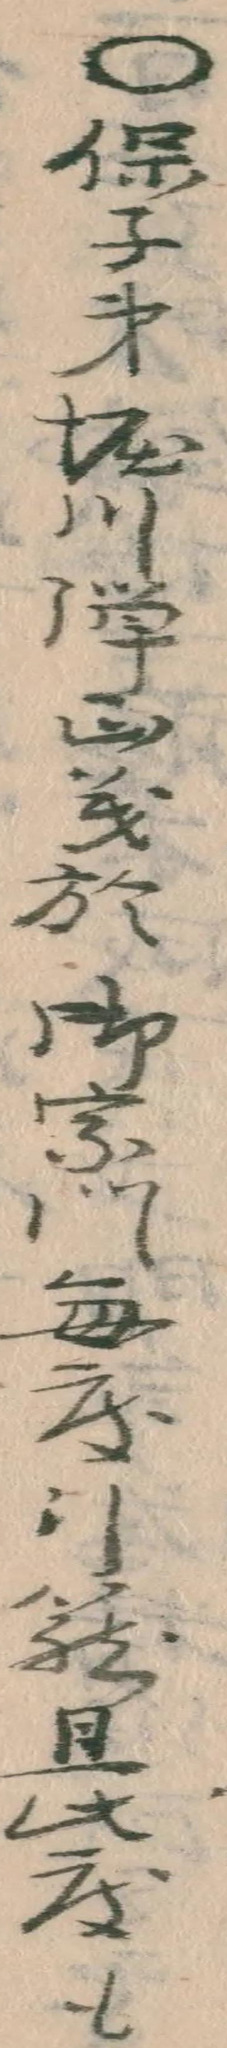〇保子弟堀川弾正義於御家門毎度引籠且此度も
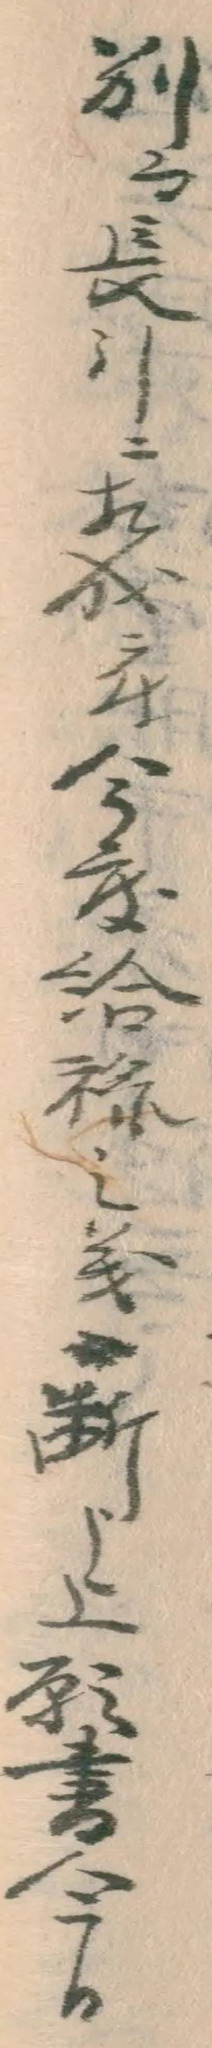別而長引ニ相成ニ付今度給禄之義断申上願書今日
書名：賀茂社記録. 第63冊
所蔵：国立国会図書館 National Diet Library, JAPAN
